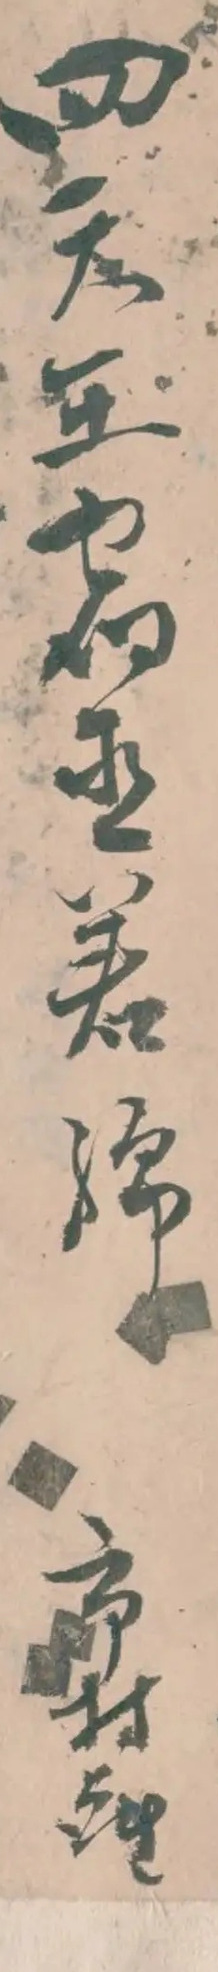四天王宿直着綿市村座

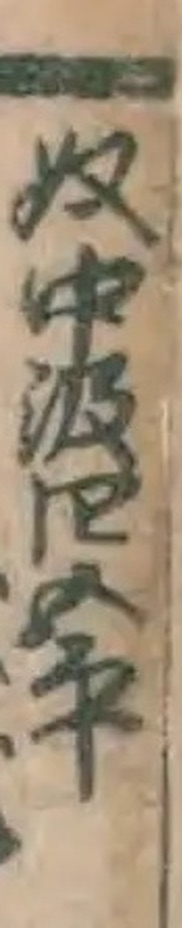奴中波四五平
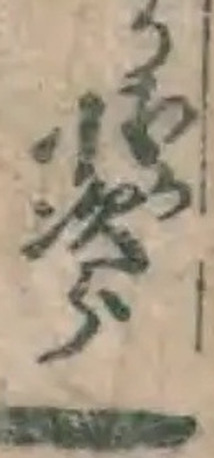小次郎
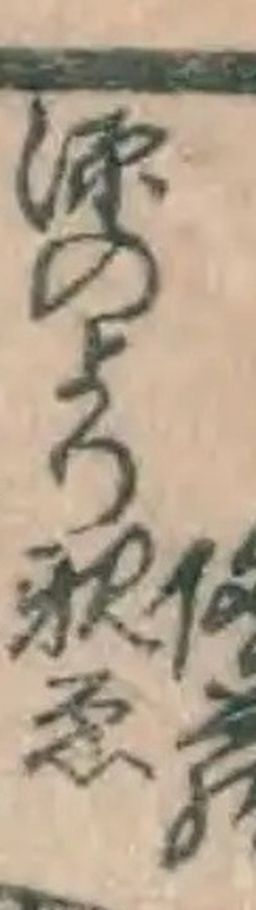源のより親ゑ
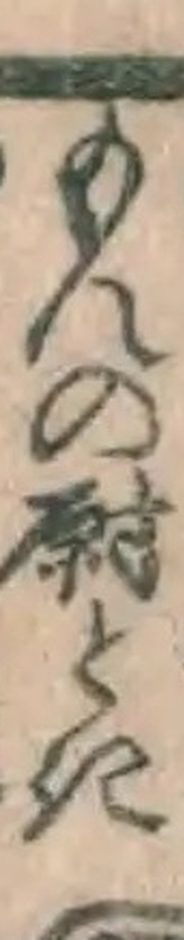もんの尉とき
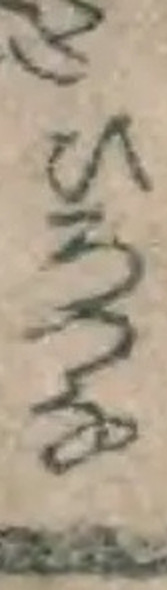ひろつな
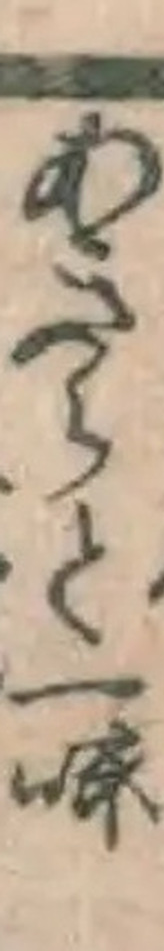あきらと一味
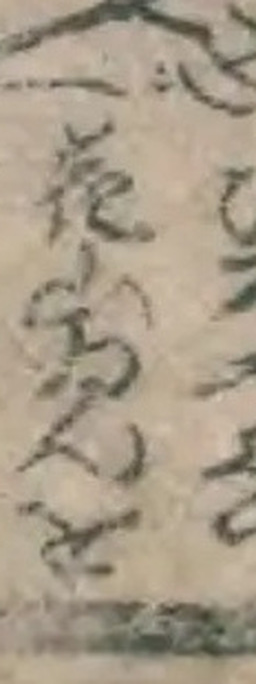花山ゐんを
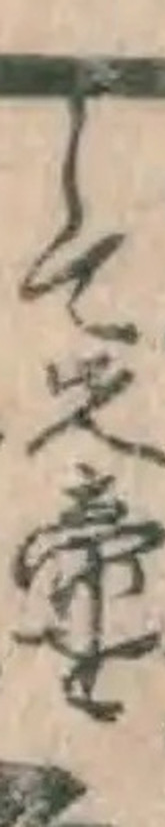して先帝を
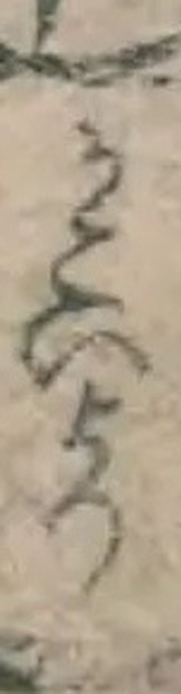かこいより
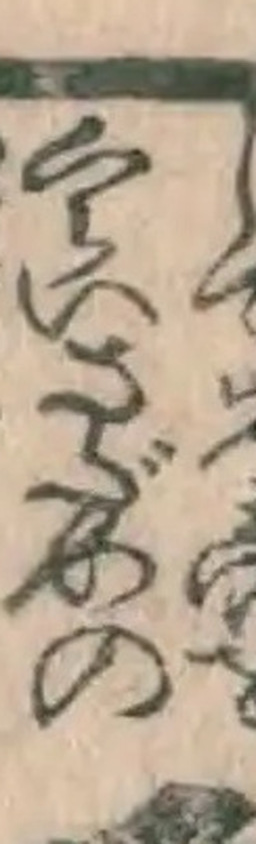くらいさだめの
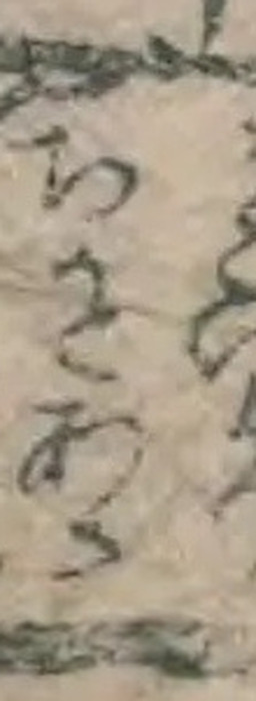ちかとあら
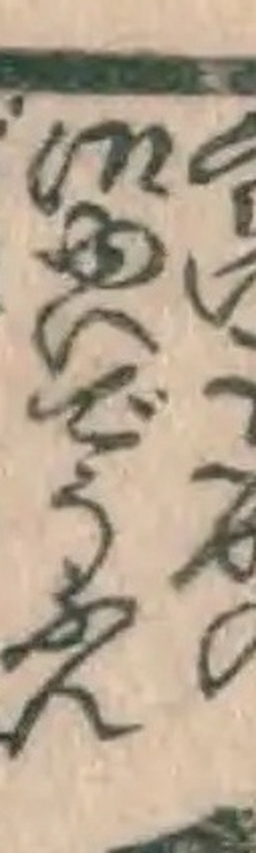御ゆいでうふん
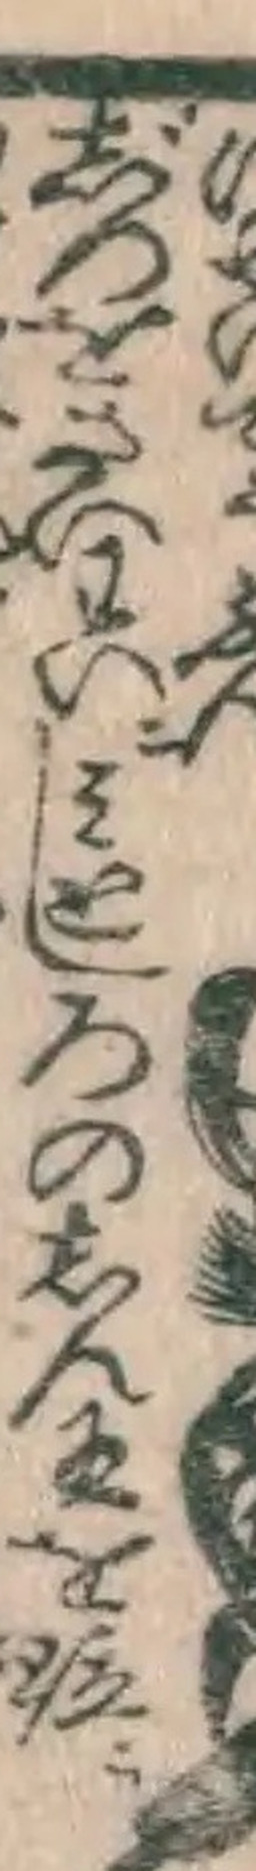じつをさいわいにみとしろのしん王を位に
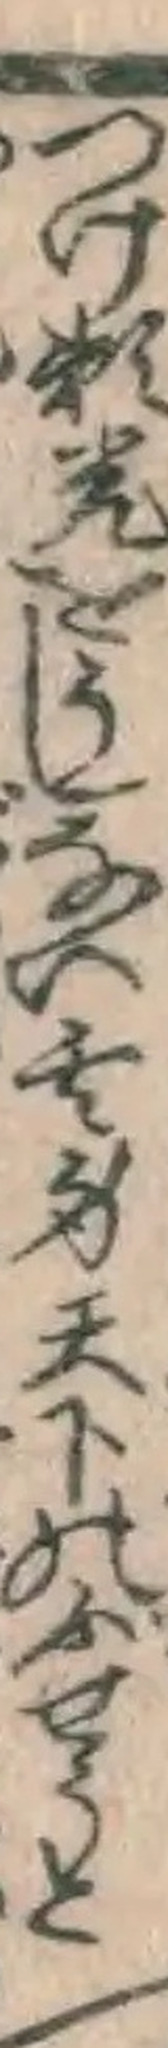つけ頼光をうしない其身天下のぶせうと
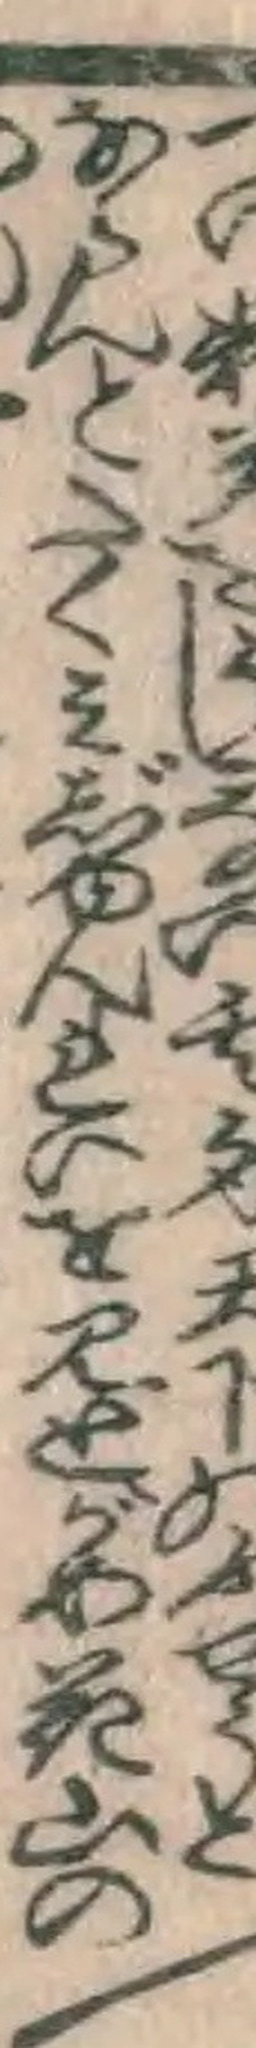ならんとたくみじゆんれいを見とがめ花山の
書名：四天王宿直着綿
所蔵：国立国会図書館 National Diet Library, JAPAN
